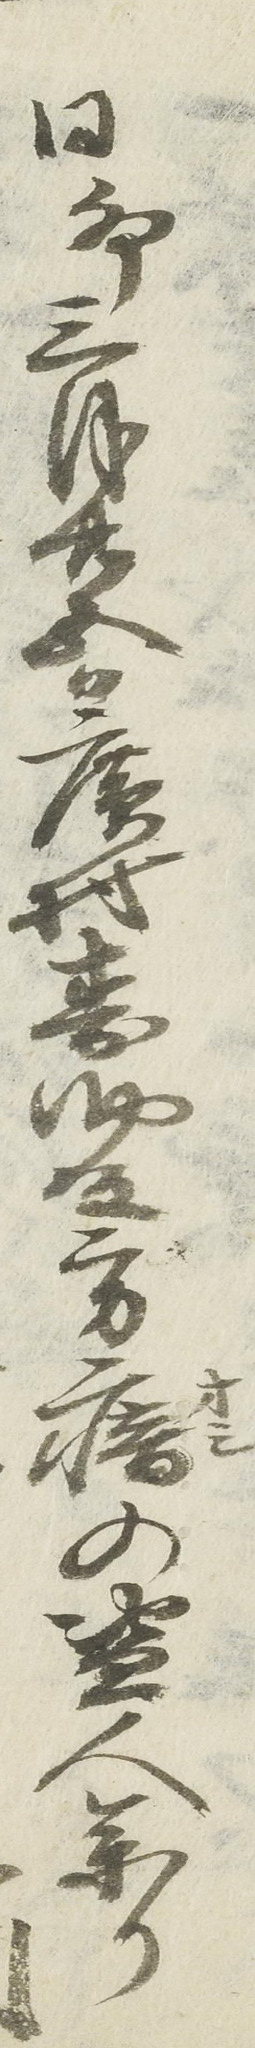一同卯三月廿五日広村寿助殿方瘖の盗人参り
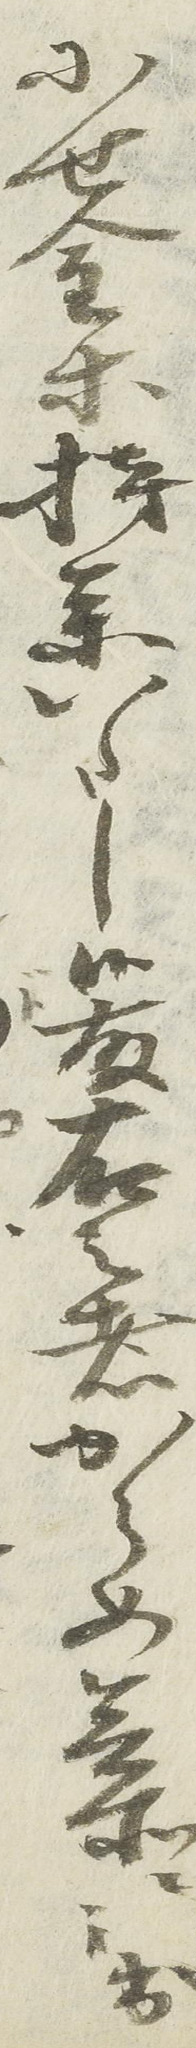にせ金等持参いたし候故右の者からめ笞所引出
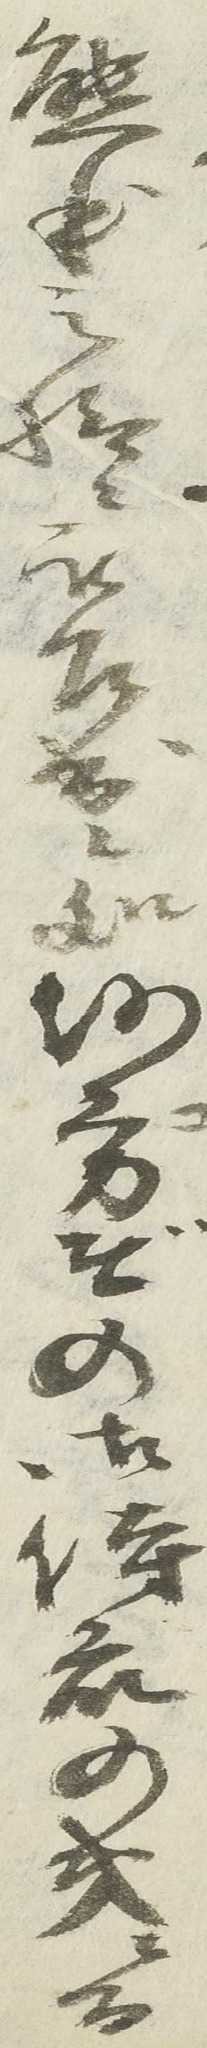熊本之様ニ被差出候処何方ぞの御侍衆の弟ニ而
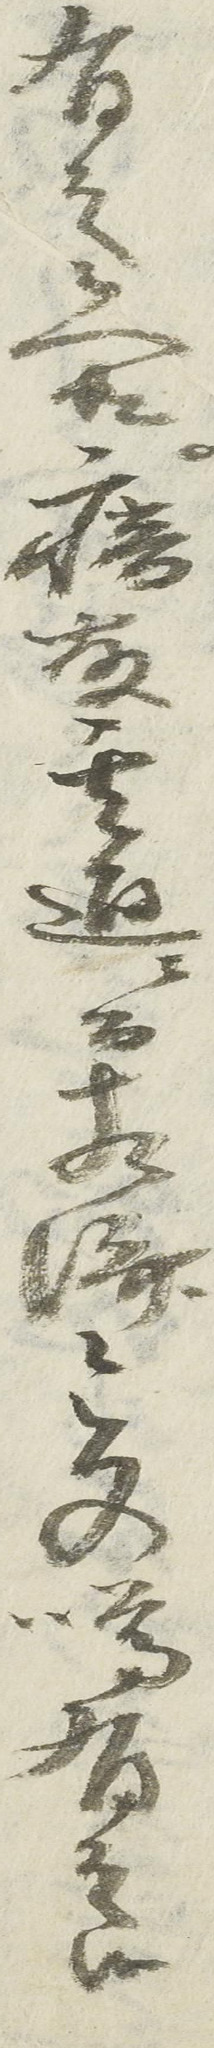有之候へ共瘖故其通ニ而相済候との噂有之候
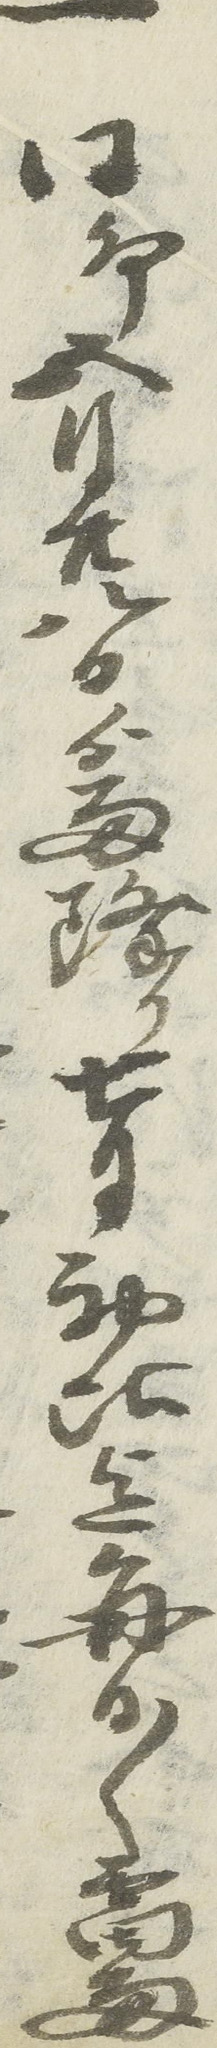一同卯五月廿八日ゟ雨降り七月初比迄毎日〳〵雷雨
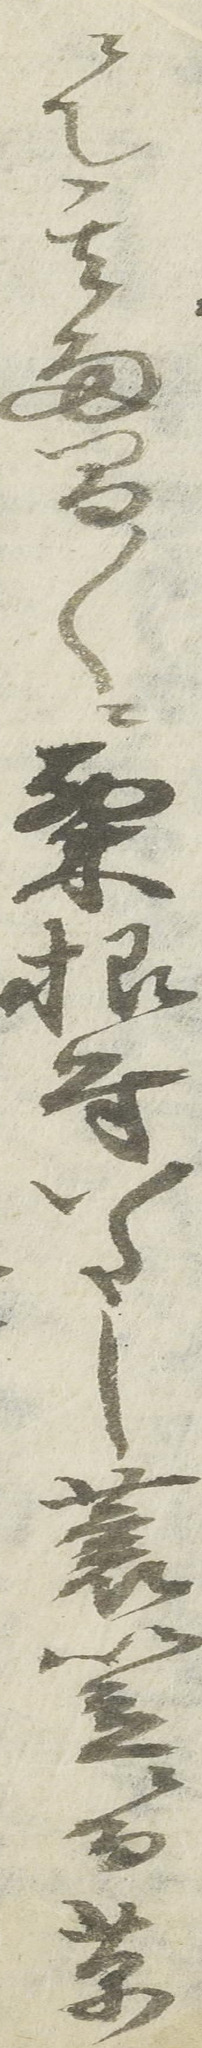ニて其雨間〳〵ニ粟根付いたし蓑笠ニ而草
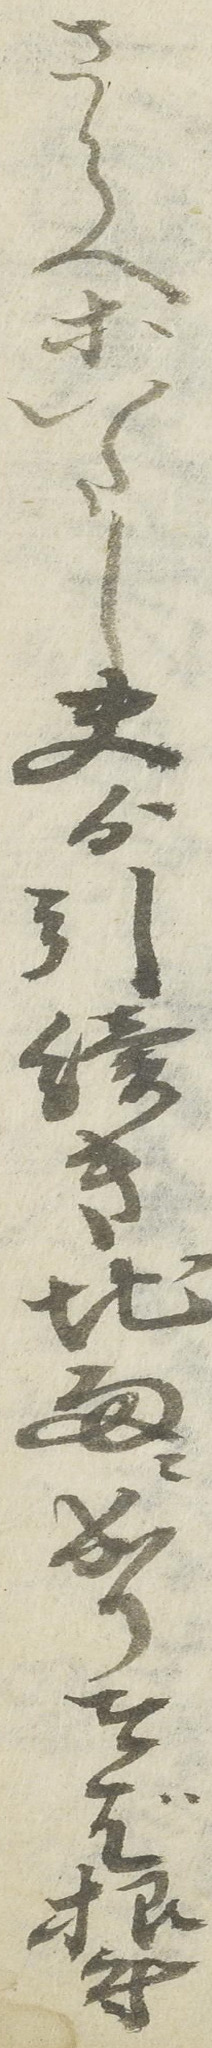さらへ等いたし夫ゟ引続き地雨ニ成りそば根付

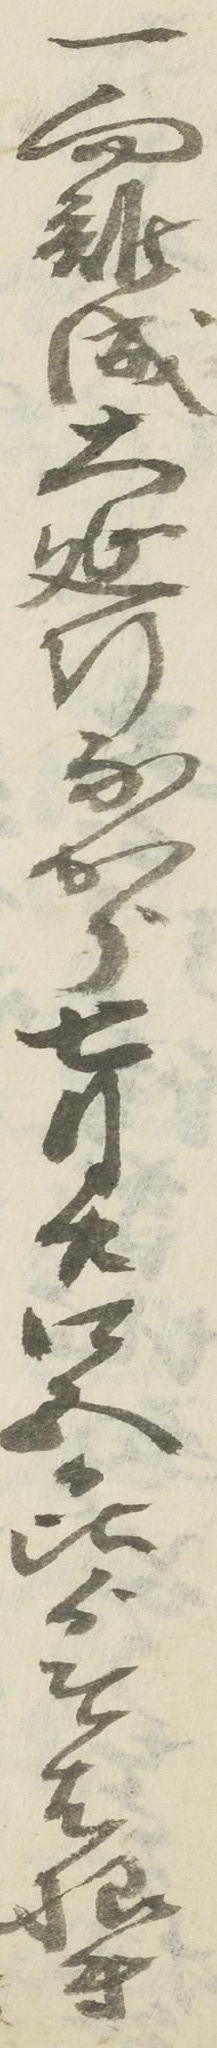一向難成大延引なから七月廿四五日頃ゟそは根付
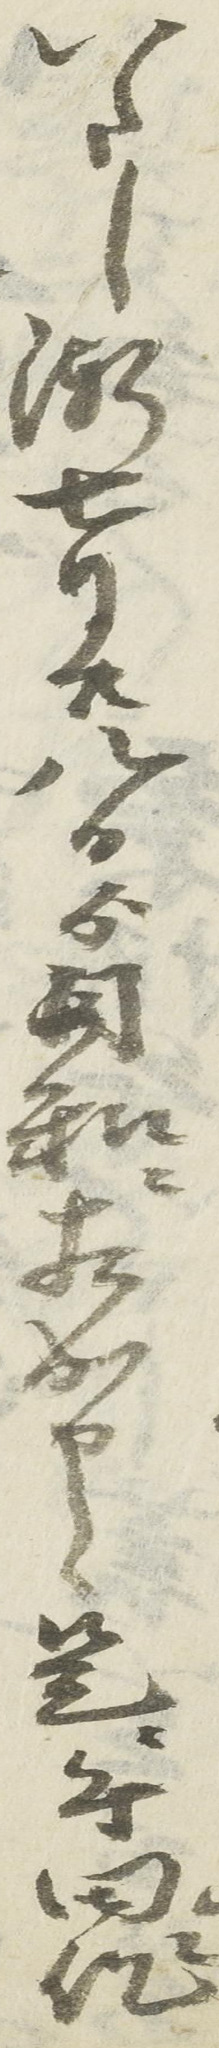いたし漸七月廿八日ゟ日和ニ相成申候是ニ付田作
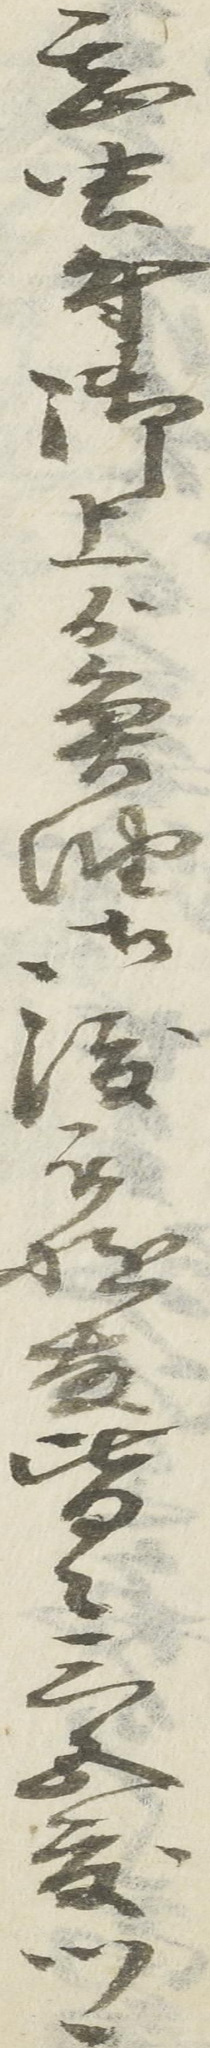甚虫付御上ゟ魚油御渡被遊故皆々三五度ツヽ
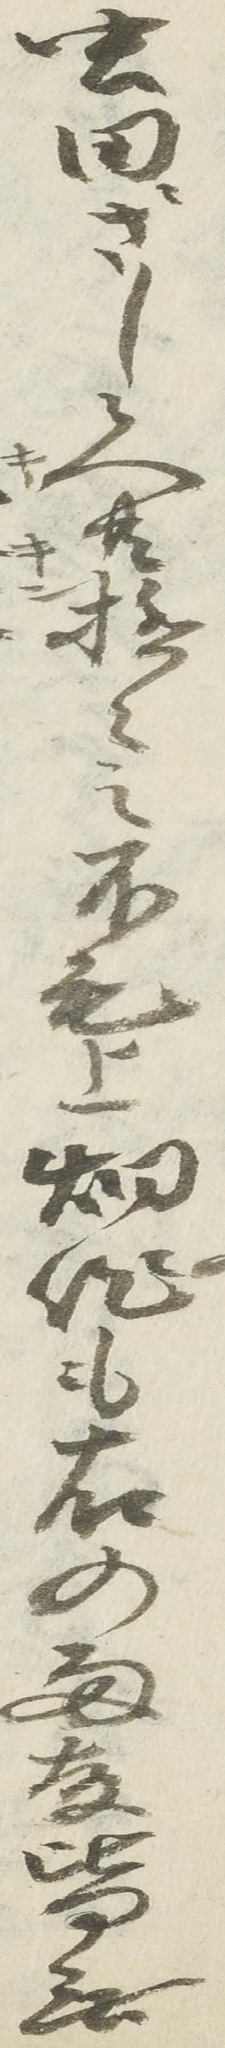虫田ニさし候へ共極々之不毛上畑作も右の雨故皆無
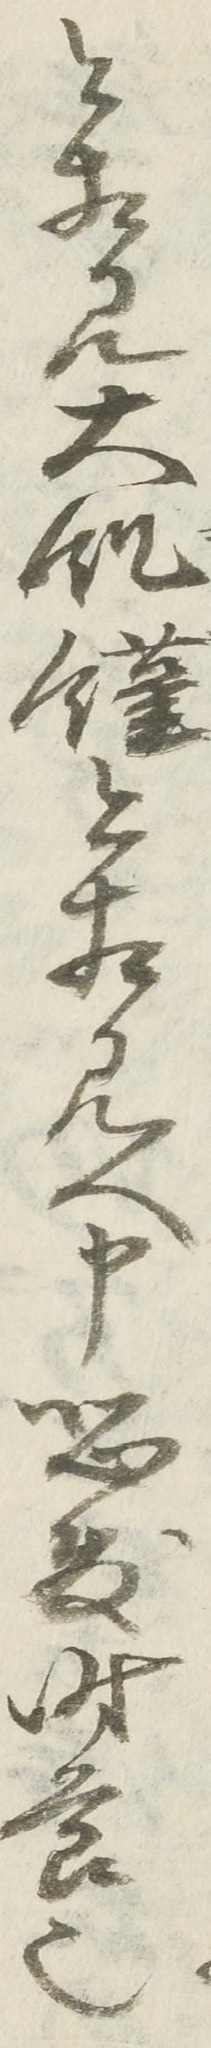と相見大飢饉と相見へ申恐敷時節也
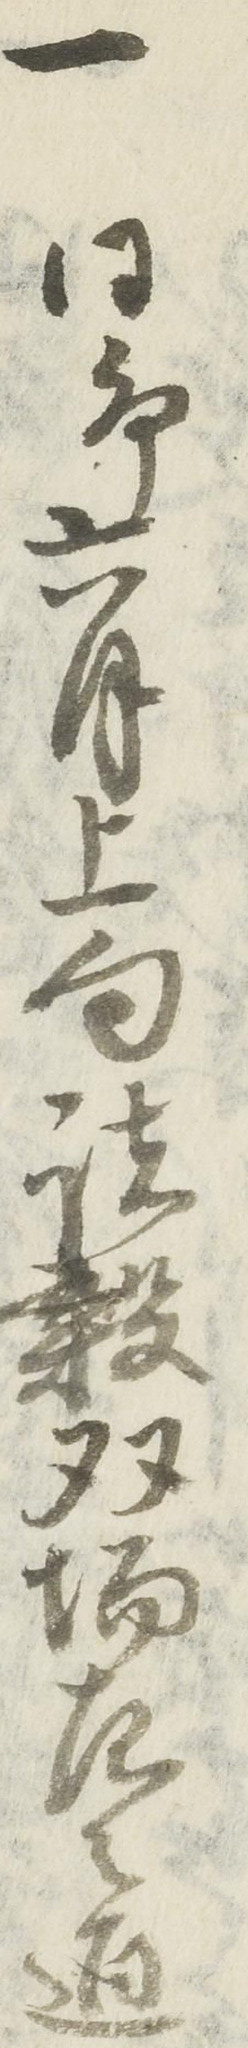一同卯六月上旬諸穀双場左之通
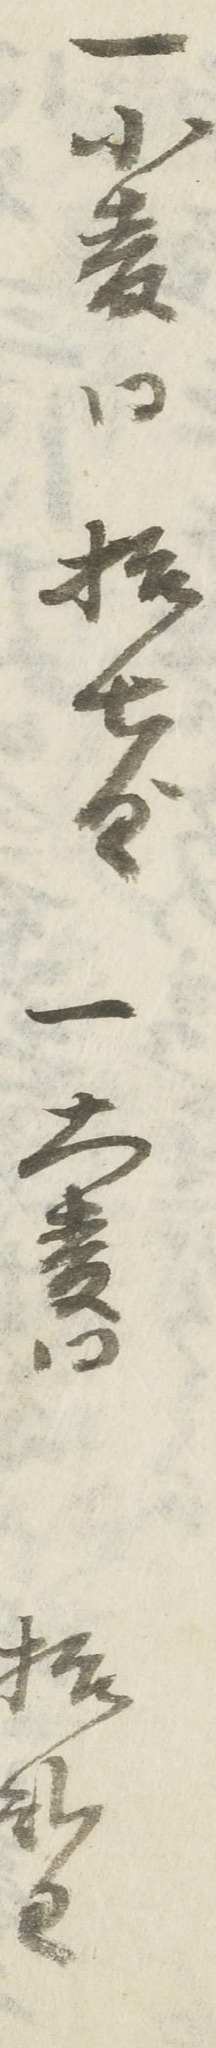一小麦同拾七匁一大麦同拾弐匁
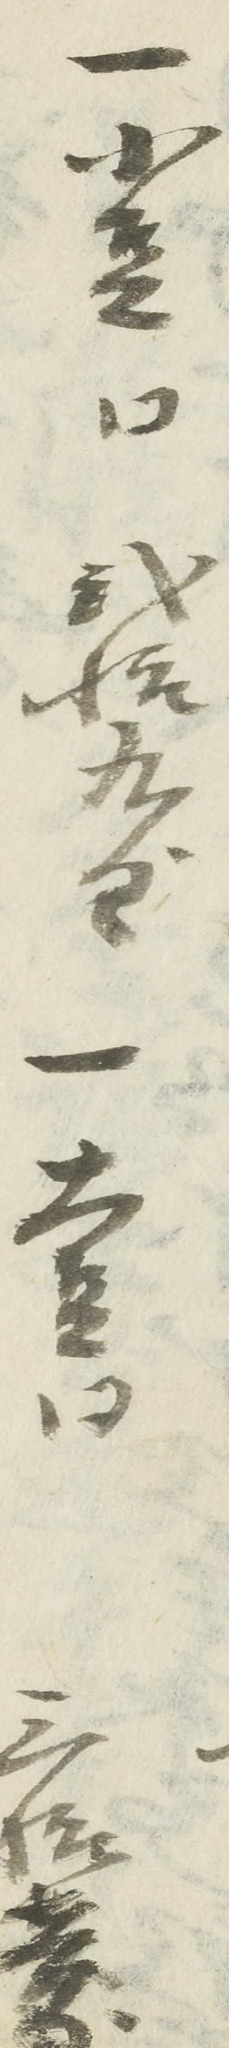一小豆同弐拾九匁一大豆同三拾壱匁
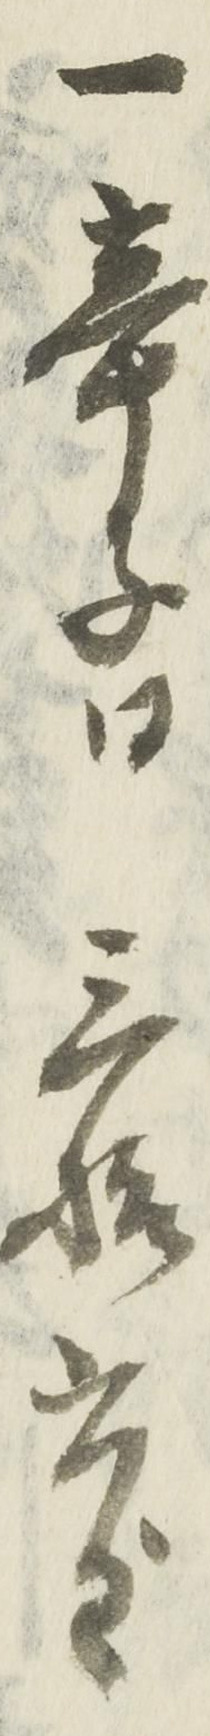一辛子同三拾六匁
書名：後見笑
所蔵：東京大学地震研究所図書室 Earthquake Research Institute Library, The University of Tokyo, JAPAN
